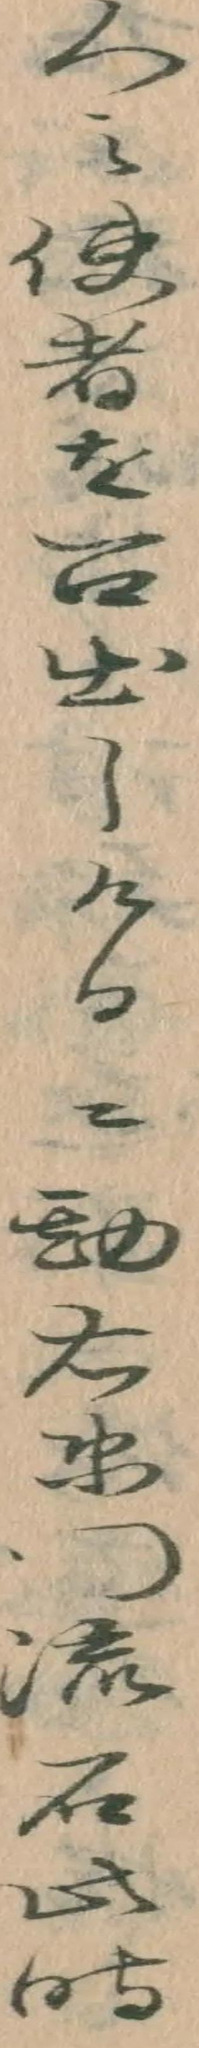人之使者を召出しけるに勘右衛門流石此時
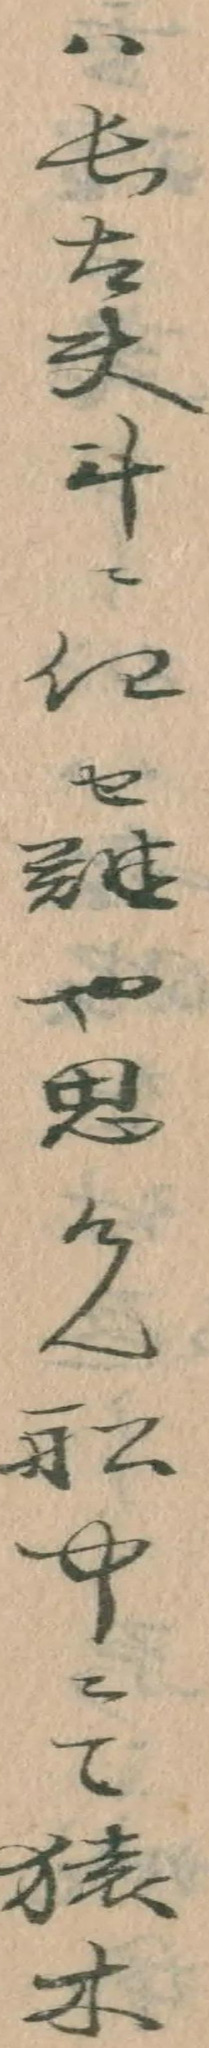は長太夫斗に任せ難や思けん舩中にて猿木
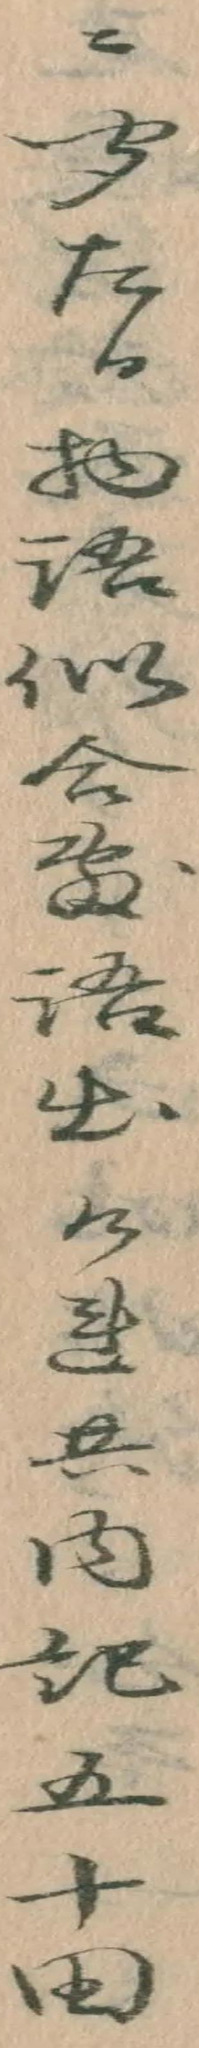に聞たる物語似合敷語出け連共内記五十田
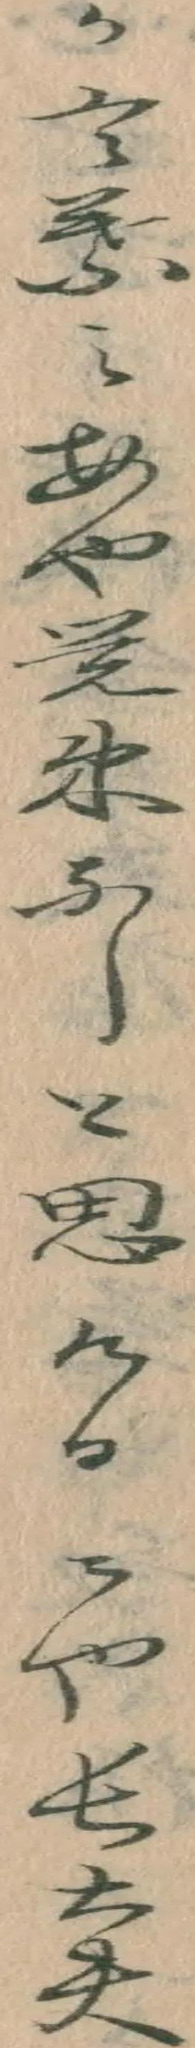か言葉之あや覚束なしと思けるにや長太夫
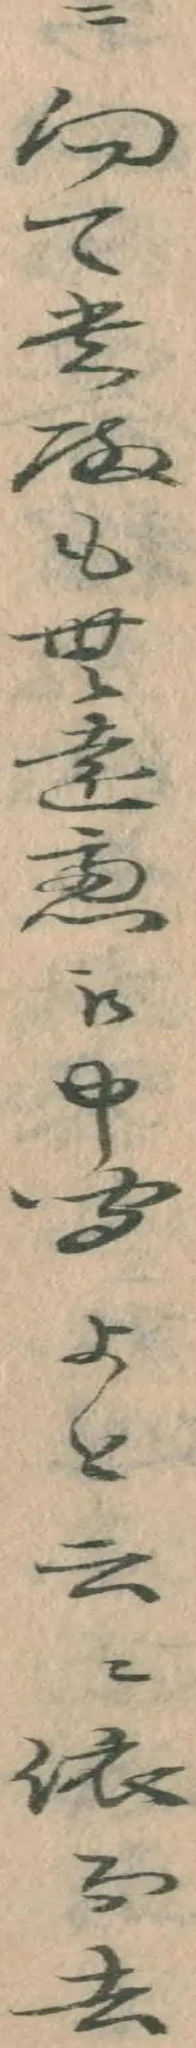に向て貴殿も無遠慮被申聞よと云に依而去
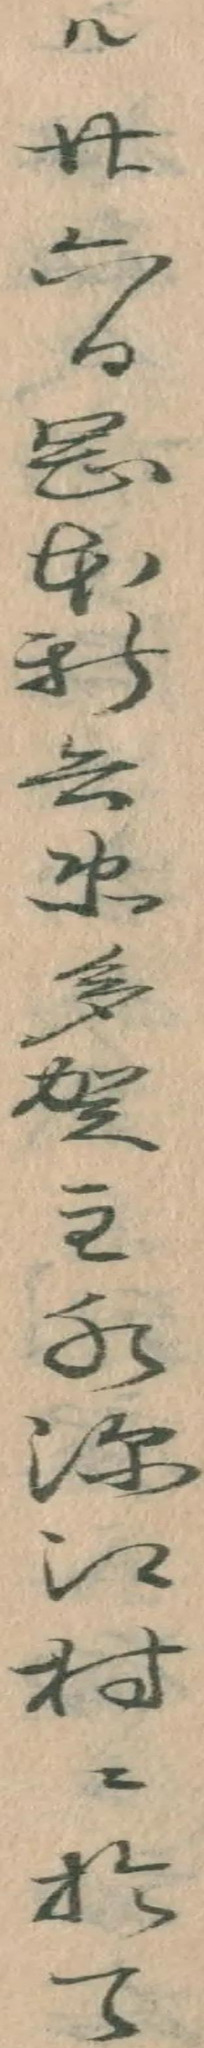る廿六日岡本新兵衛多賀主水深江村に於て
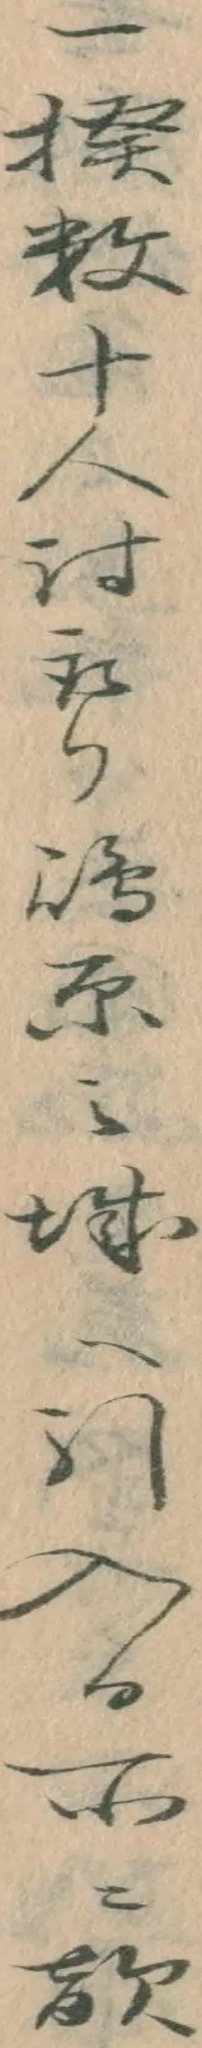一揆数十人討取り島原之城へ引入る所に敵
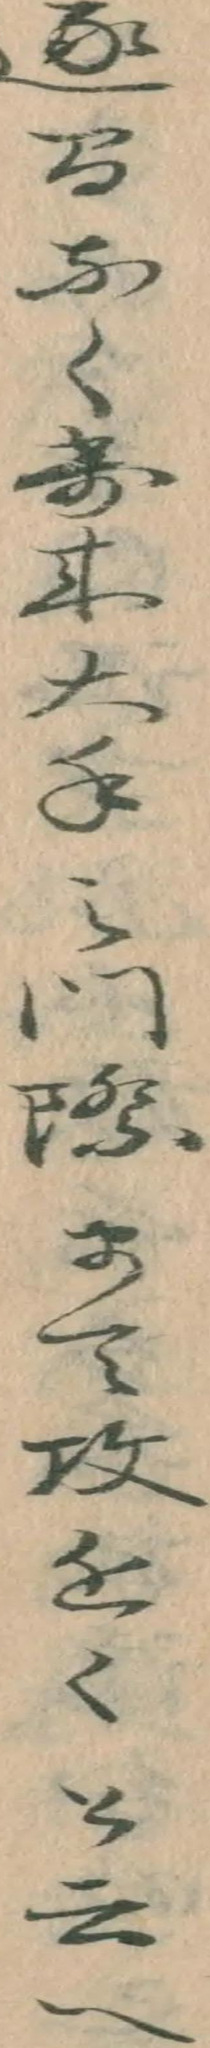逐間なく寄来大手之門際まて攻近くと云へ
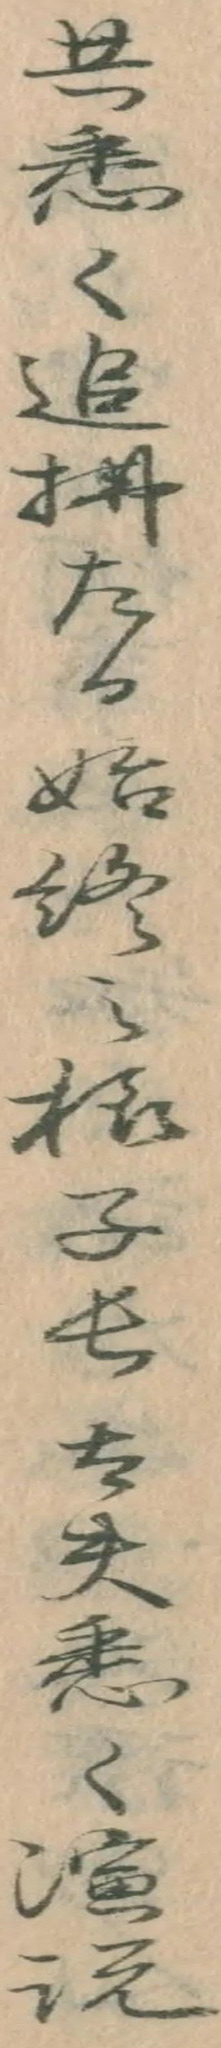共悉く追払たる始終之様子長太夫悉く演説

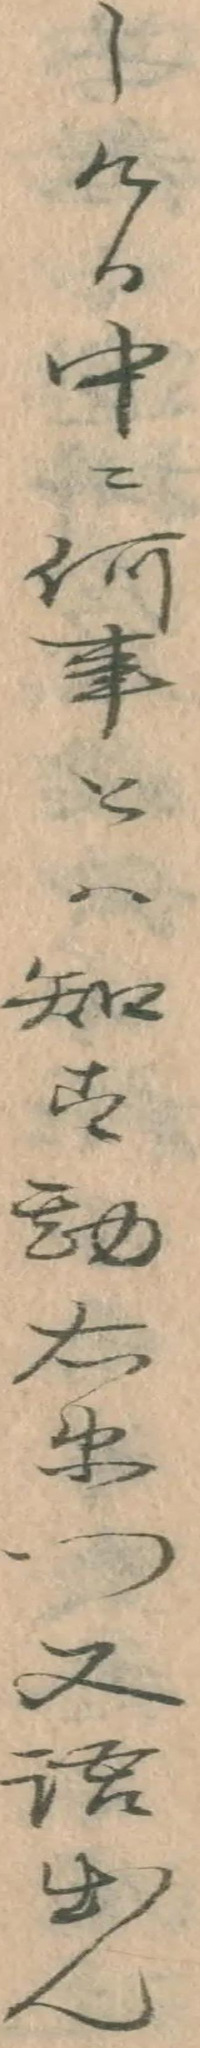しける中に何事とは知す春勘右衛門又語出ん
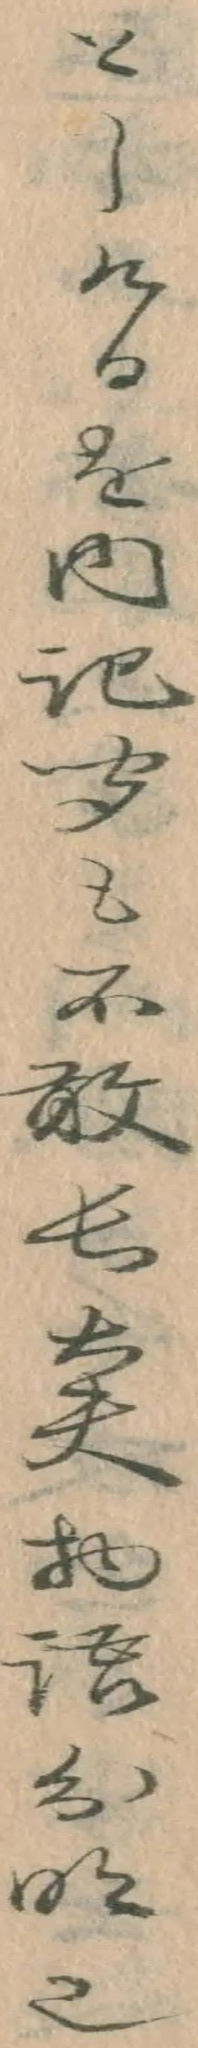としけるを内記聞も不敢長太夫物語分明也
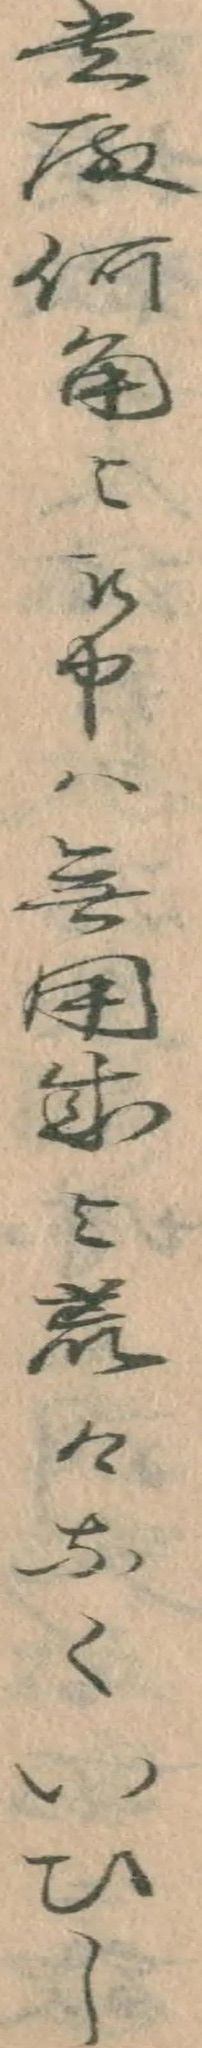貴殿何角与被申は無用成与荒けなくいひし
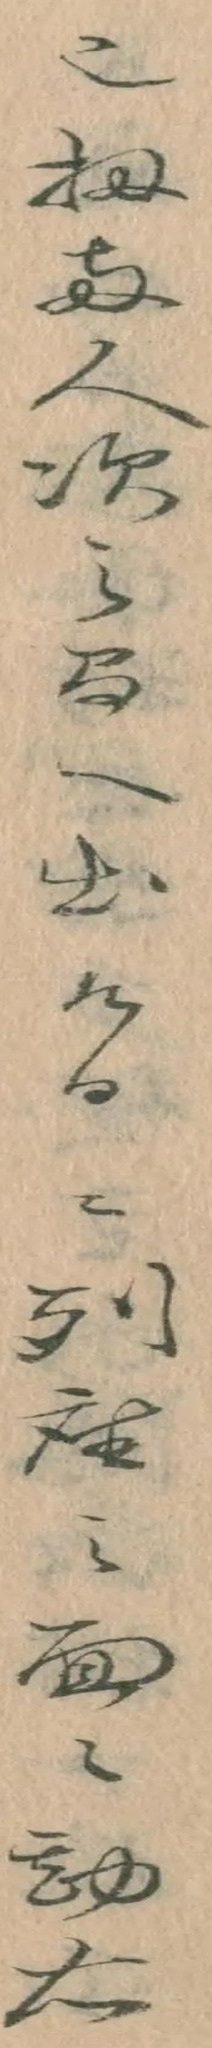也扨両人次之間へ出けるに列座之面々勘右
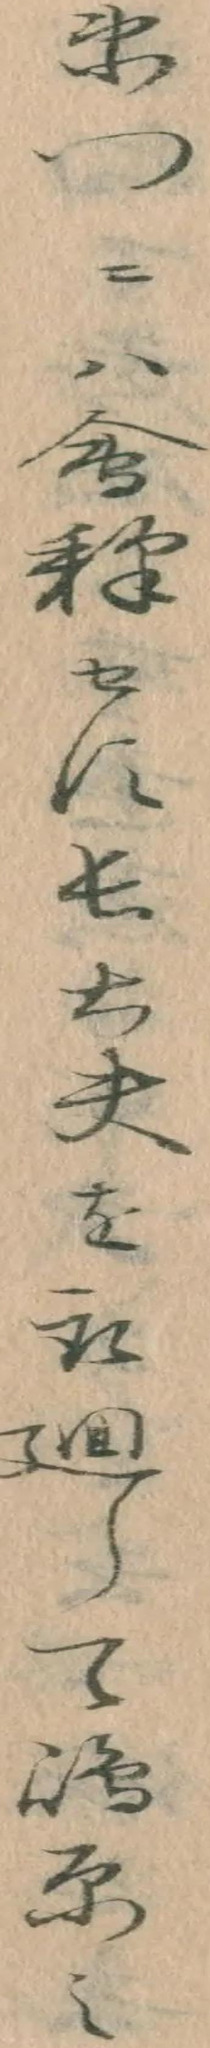衛門には会釈せ須長太夫を取廻して島原之
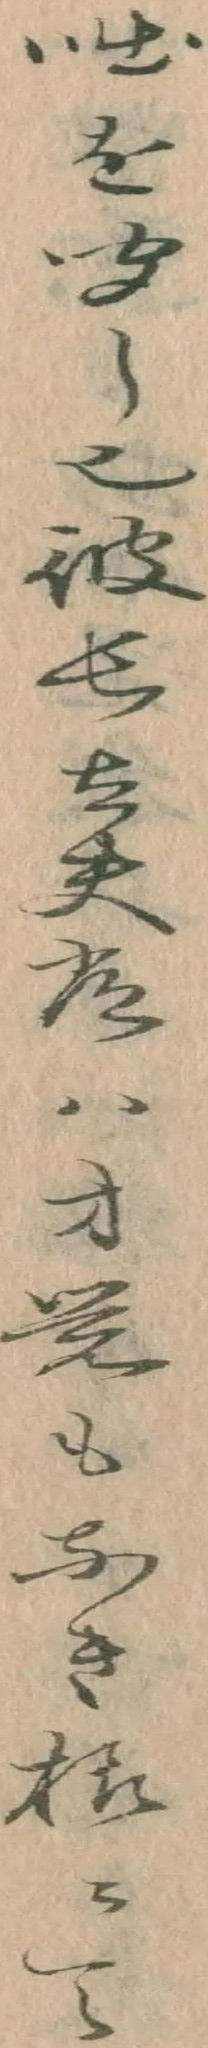咄を聞し也彼長太夫常は才覚もなき様にて
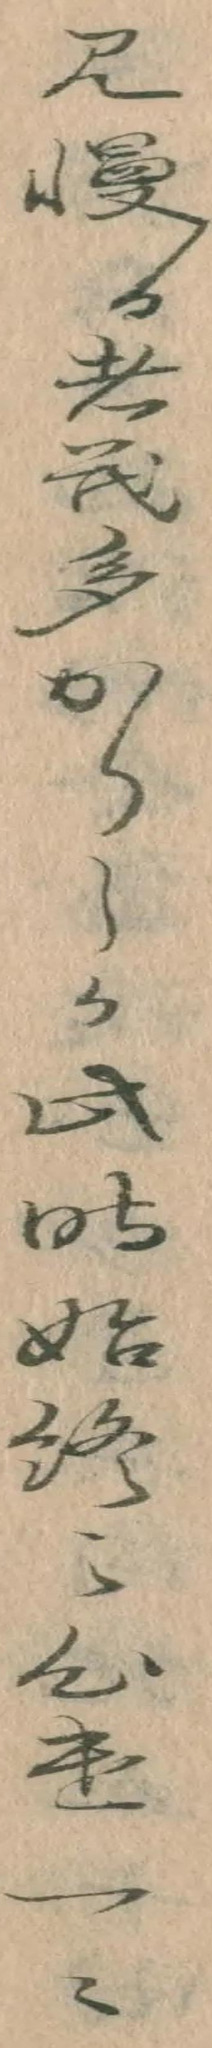見慢る者茂多かりしか此時始終之心遣一々
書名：切支丹御退治記 49巻. [2]
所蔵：国立国会図書館 National Diet Library, JAPAN
